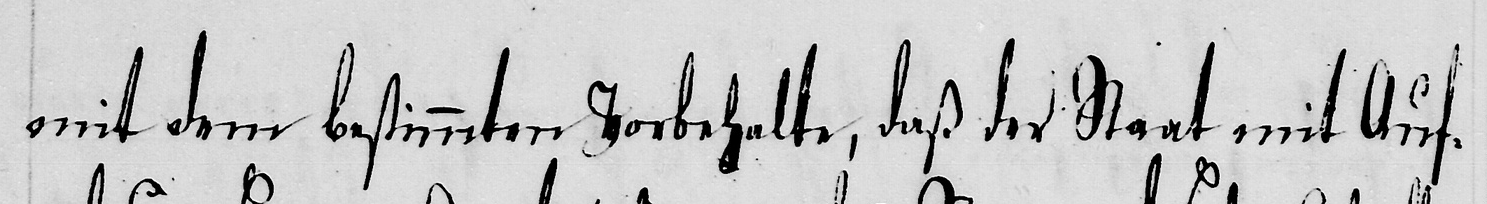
mit dem bestimmten Vorbehalte, daß der Staat mit Auf¬
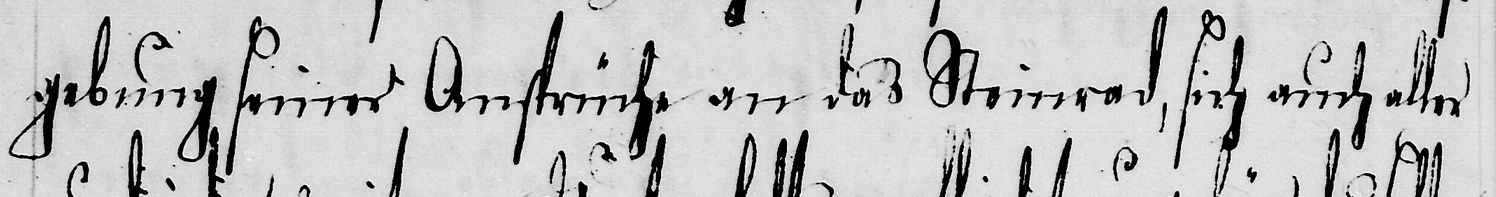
gebung seiner Ansprüche an das Steinrad, sich auch al¬
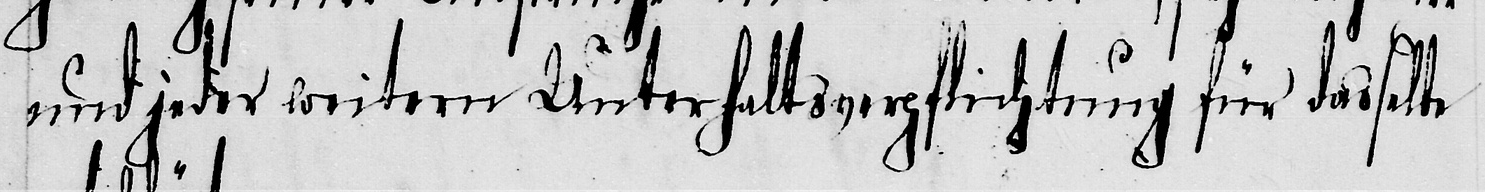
und jeder weitern Unterhaltsverpflichtung für dasselbe
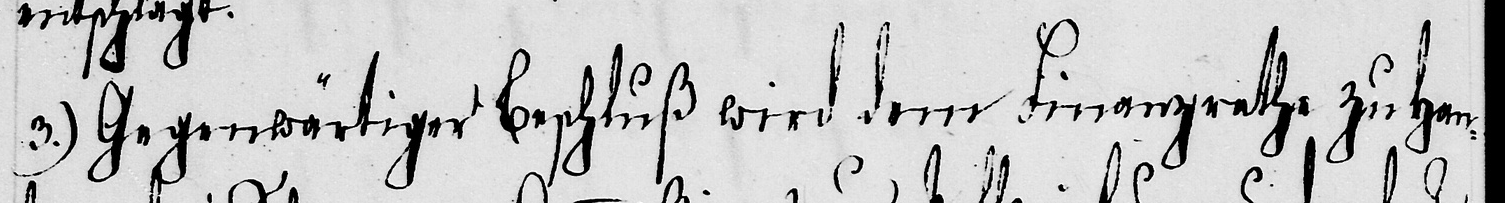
3.) Gegenwärtiger Beschluß wird dem Finanzrathe zu Han¬
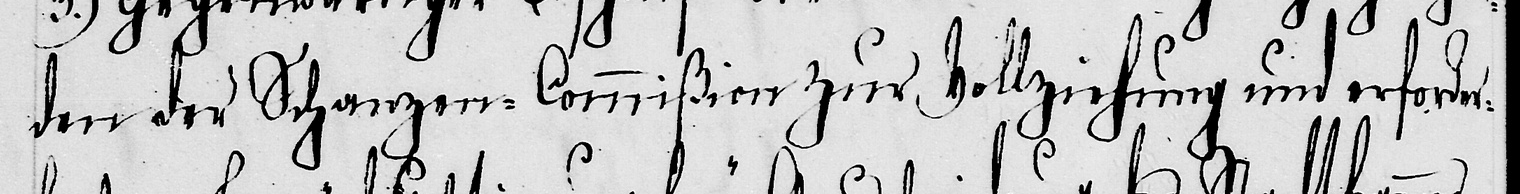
den der Schanzen-Commißion zur Vollziehung und erforde¬
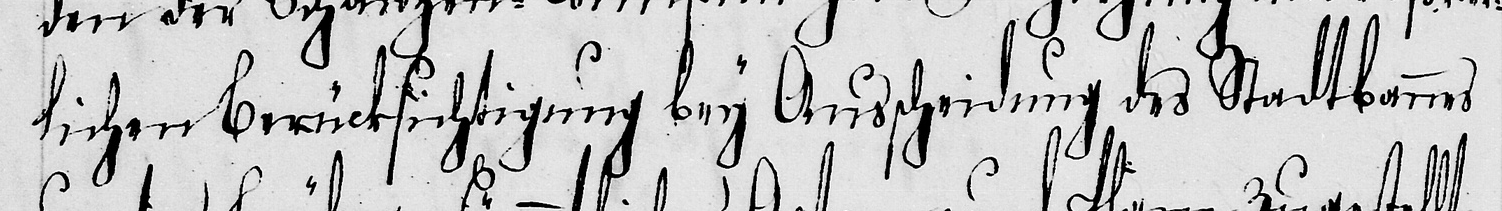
rlichen Berücksichtigung bey Ausscheidung des Stadtbaues
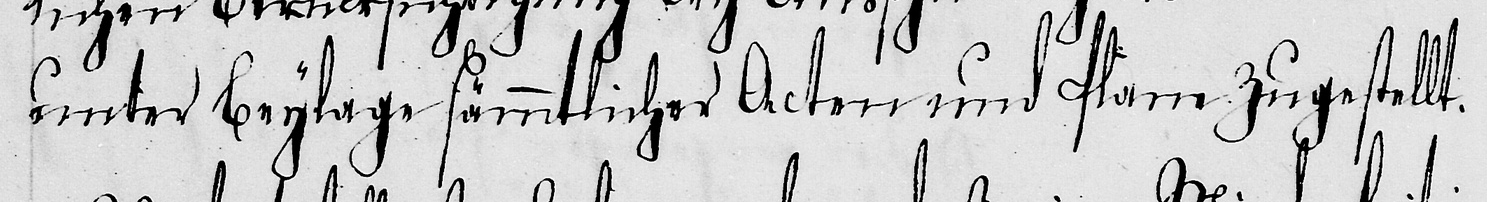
unter Beylage sämmtlicher Acten und Plane zugestel¬
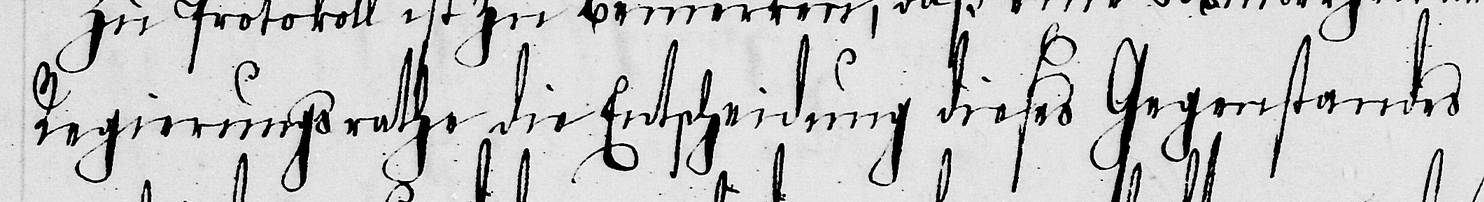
Regierungsrathe die Entscheidung dieses Gegenstandes
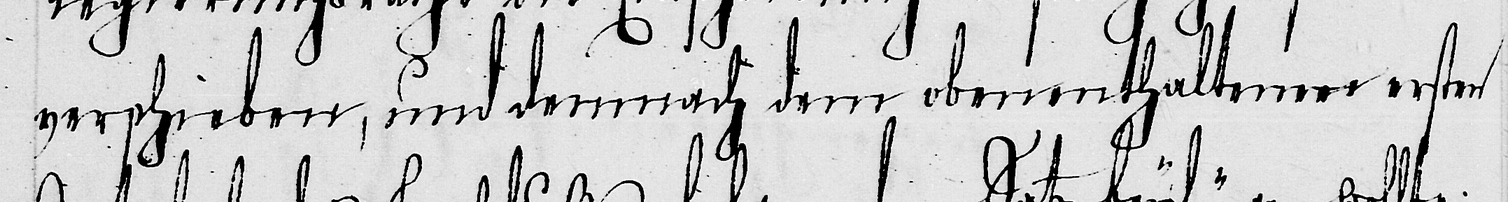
verschieben, und demnach dem obenenthaltenen ersten
